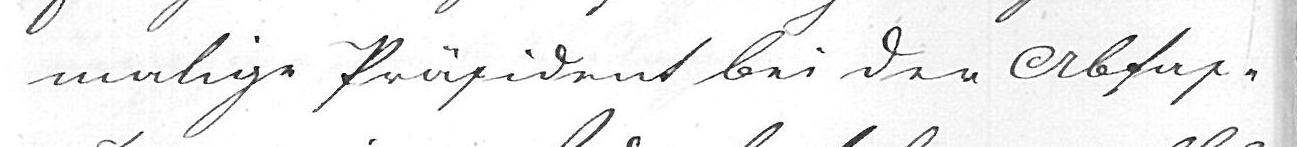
malige Präsident bei der Abfas-
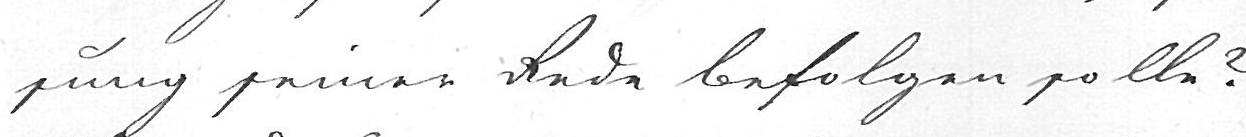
sung seiner Rede befolgen solle?
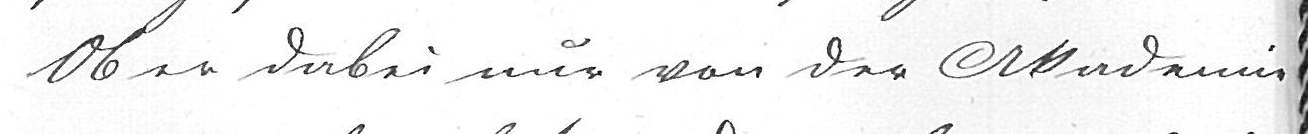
Ob er dabei nur von der Akademie
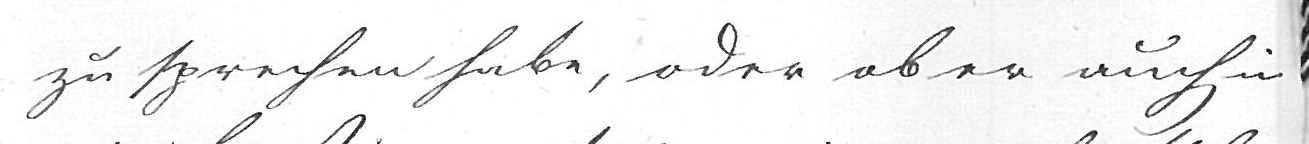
zu sprechen habe, oder ob er auch in
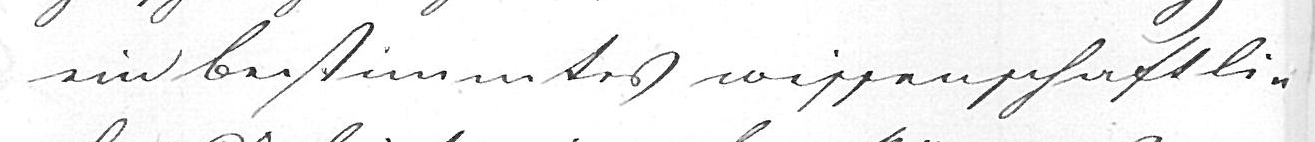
ein beistimmtes wissenschaftli-
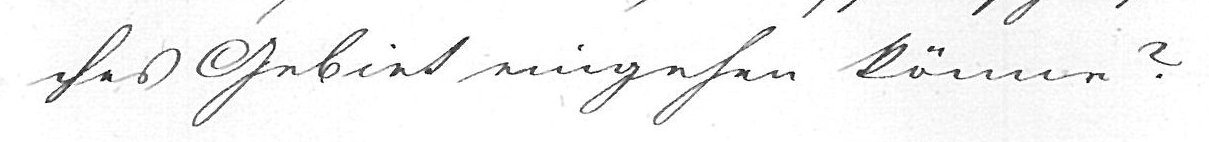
ches Gebiet eingehen könne?
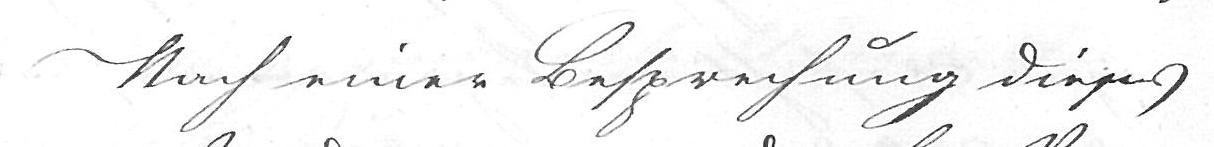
Nach einer Besprechung dieses
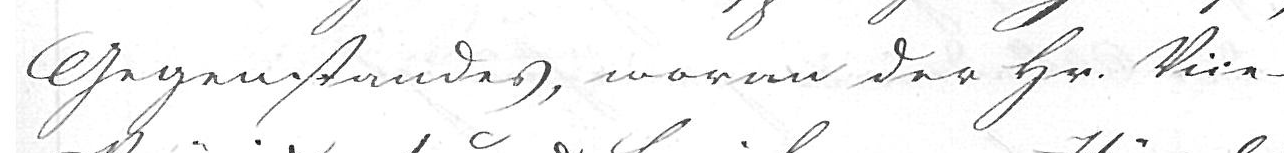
Gegenstandes, worin der Hr. Vice-
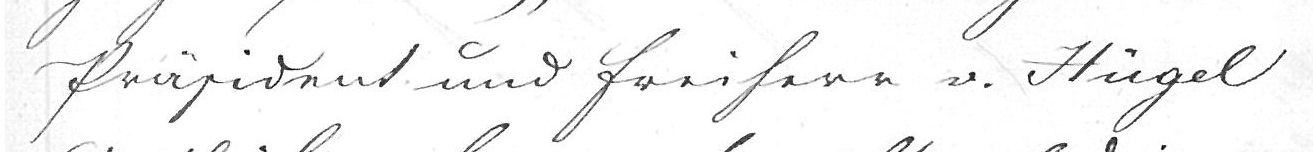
Präsident und Freiherr v. Hügel
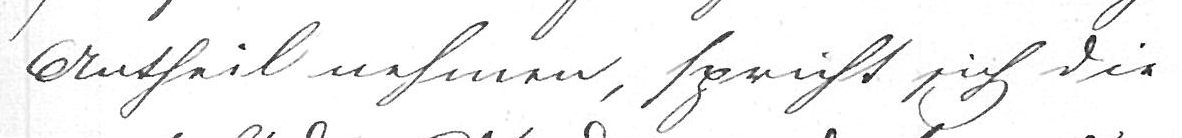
Antheil nehmen, spricht sich die
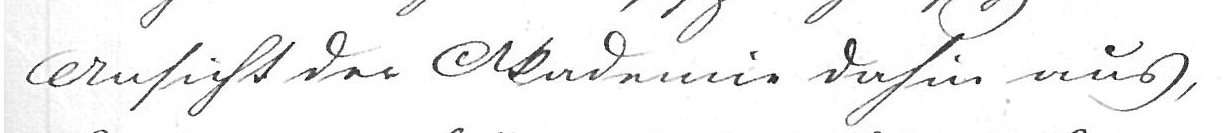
Ansicht der Akademie dahin aus,
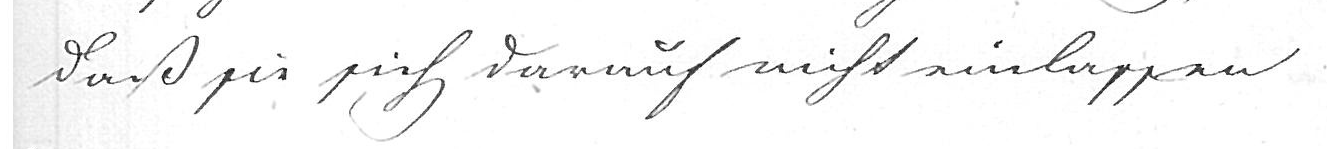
daß sie sich darauf nicht einlassen
